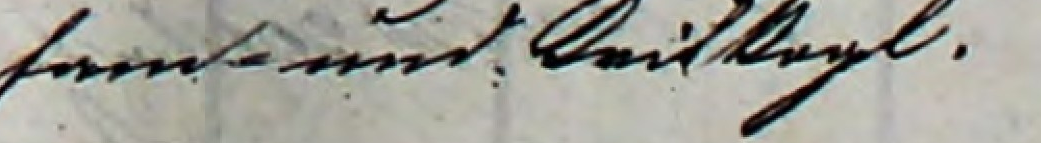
sam= und Krit kogl.
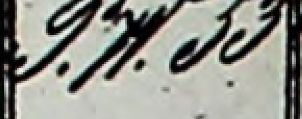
P.W. 53
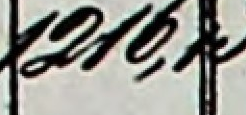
1216,1
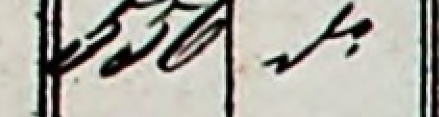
556 do
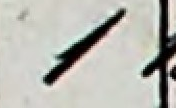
1
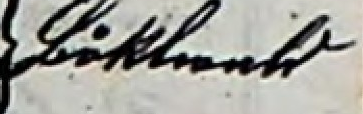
Böklwald
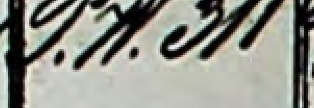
P.W. 311
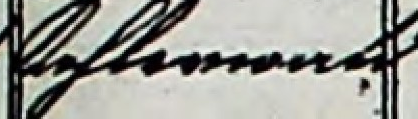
Kehlermald
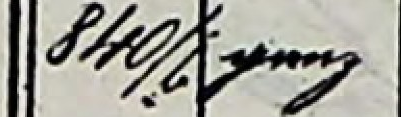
840/b ganz
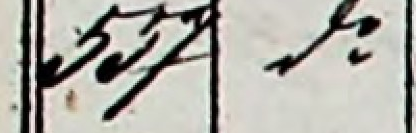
557 do
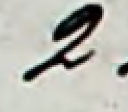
2
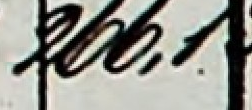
266,1
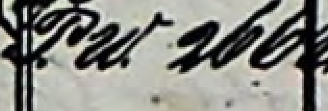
P.W 266
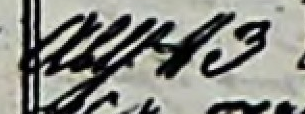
Abth N 3
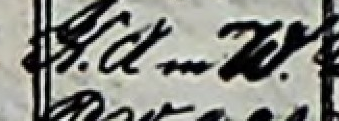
K.A m W.
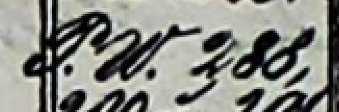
P.W. 288,
